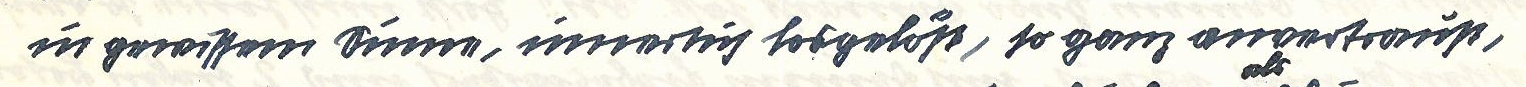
in gewissem Sinne, innerlich losgelöst, so ganz anvertraust,
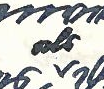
als
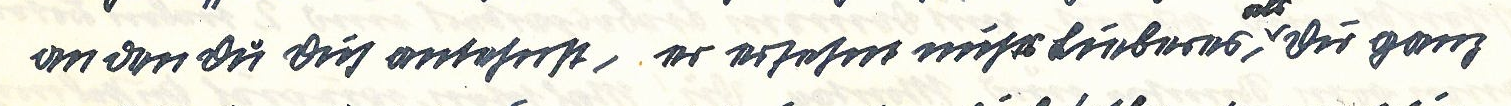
an den Du Dich anlehnst, er ersehnt nichts Lieberes, Dir ganz
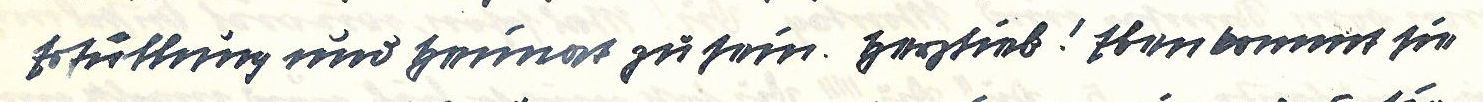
Erfüllung und Heimat zu sein. Herzlieb! Eben kommt sie
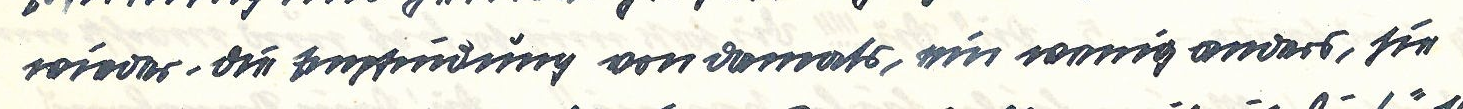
wieder, die Empfindung von damals, ein wenig anders, sie
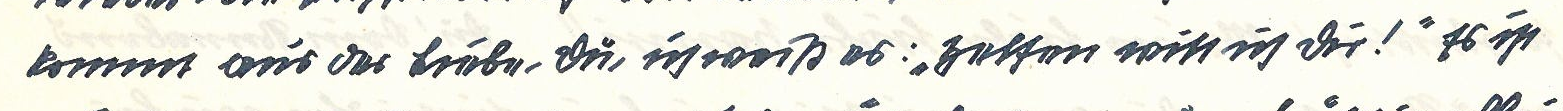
kommt aus der Liebe, Du, ich weiß es: „Helfen will ich Dir!” Es ist
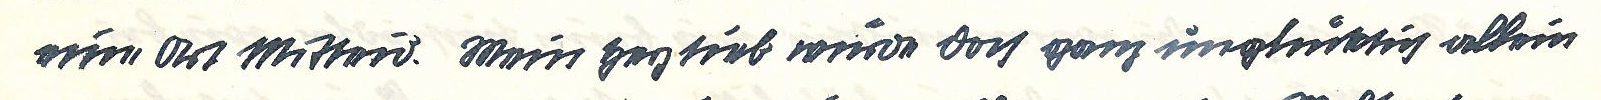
eine Art Mitleid. Mein Herzlieb würde doch ganz unglücklich allein
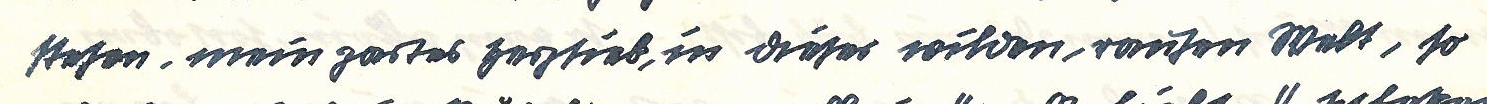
stehen, mein zartes Herzlieb, in dieser wilden, rauen Welt, so
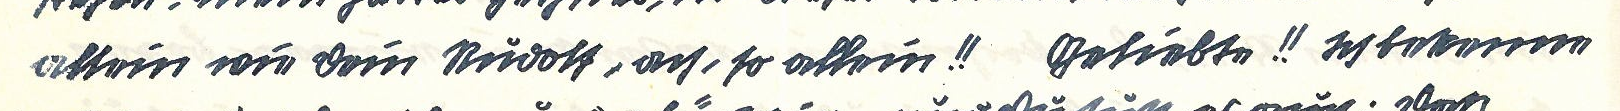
allein, wie Dein Rudolf, ach, so allein!! Geliebte!! Ich bekenne
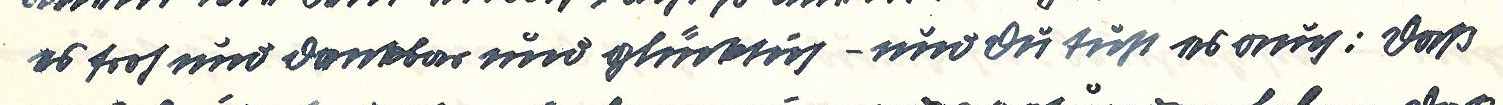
es froh und dankbar und glücklich – und Du tust es auch: Daß
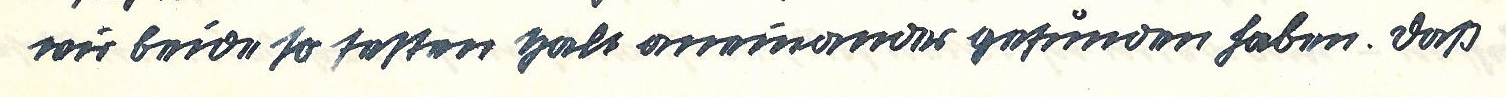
wir beide so festen Halt aneinander gefunden haben. Daß
